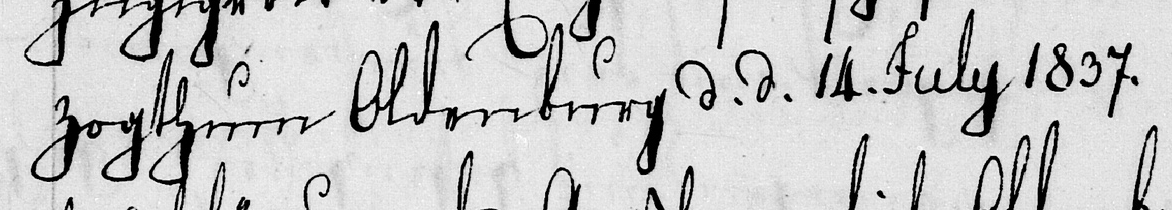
zogthum Oldenburg d. d. 14. July 1837.
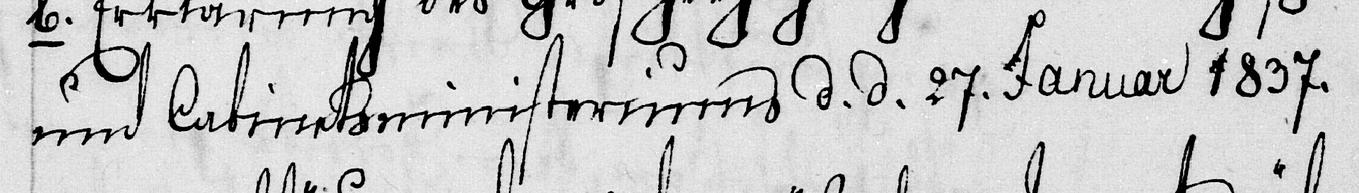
und Cabinetsministeriums d. d. 27. Januar 1837.
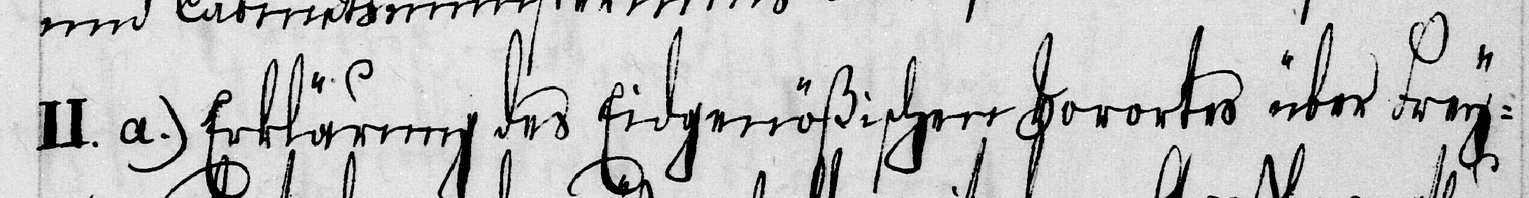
a.) Erklärung des Eidgenößischen Vorortes über Frey¬
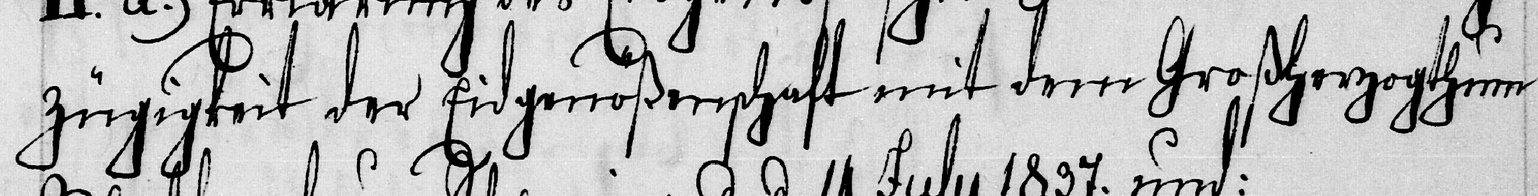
zügigkeit der Eidgenoßenschaft mit dem Großherzogthum
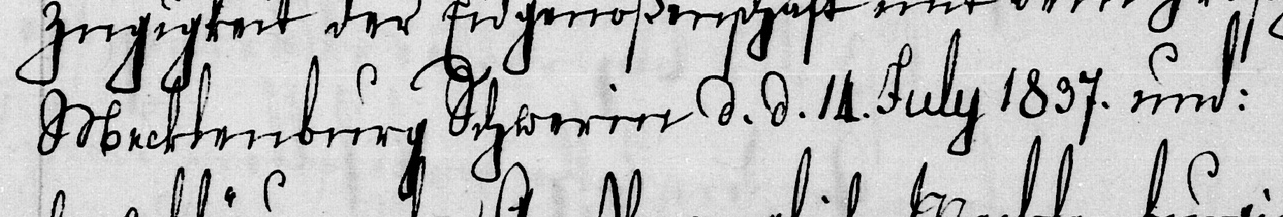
Mecklenburg Schwerin d. d. 14. July 1837. und:
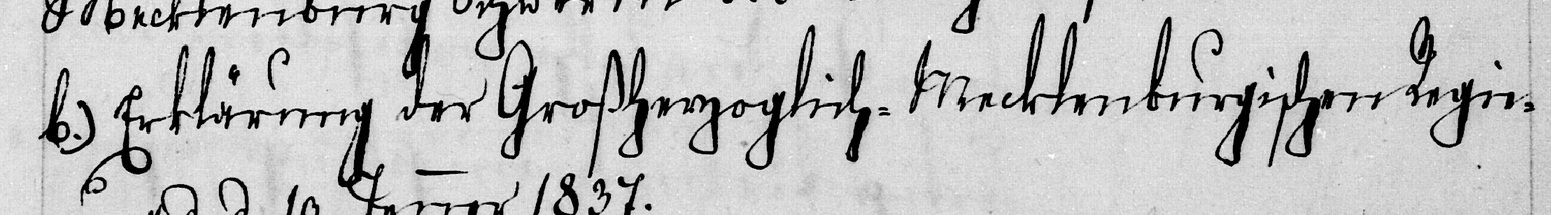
b.) Erklärung der Großherzoglich-Mecklenburgischen Regie¬
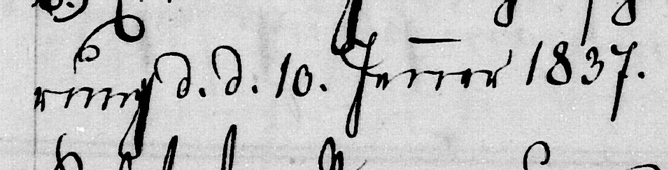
rung d. d. 10. Jenner 1837.
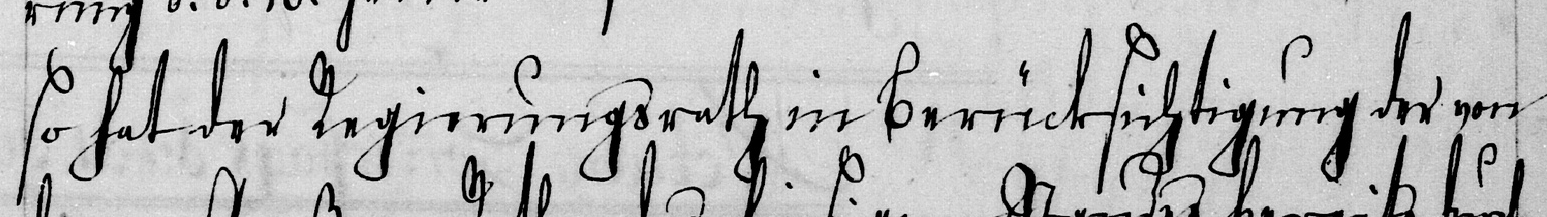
So hat der Regierungsrath in Berücksichtigung der von
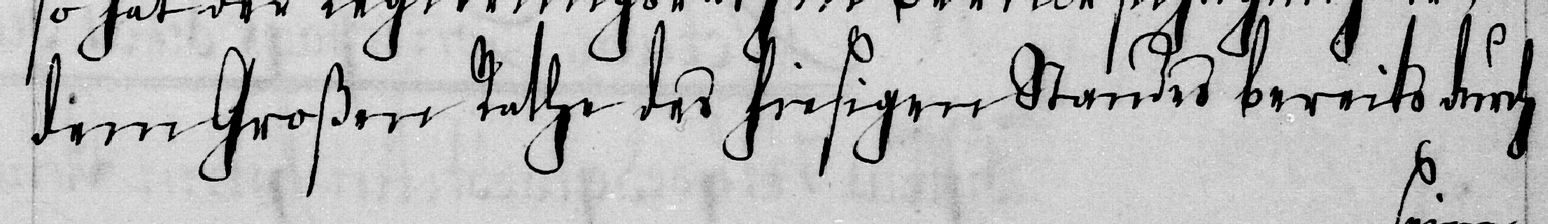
dem Großen Rathe des hiesigen Standes bereits durch
